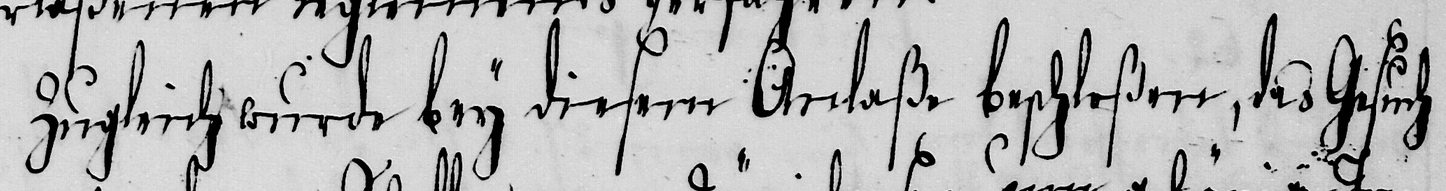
Zugleich wurde bey diesem Anlaße beschloßen, das Ges¬
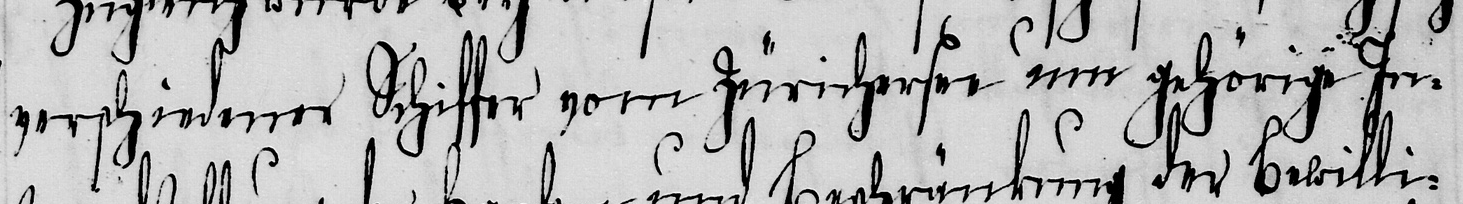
verschiedener Schiffer vom Zürichsee um gehörige In¬
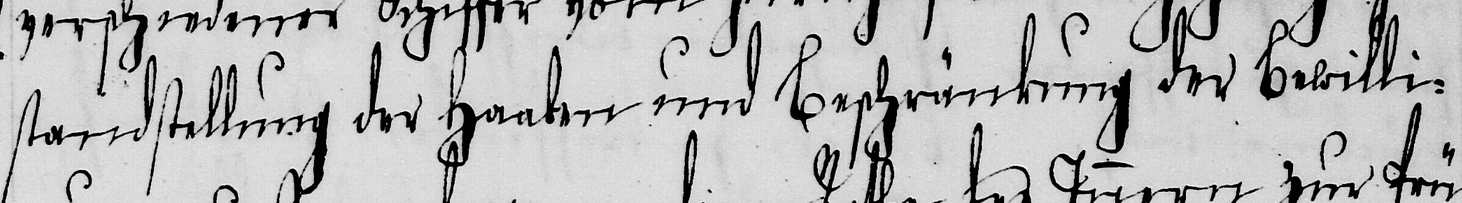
standstellung der Haaben und Beschränkung der Bewilli¬
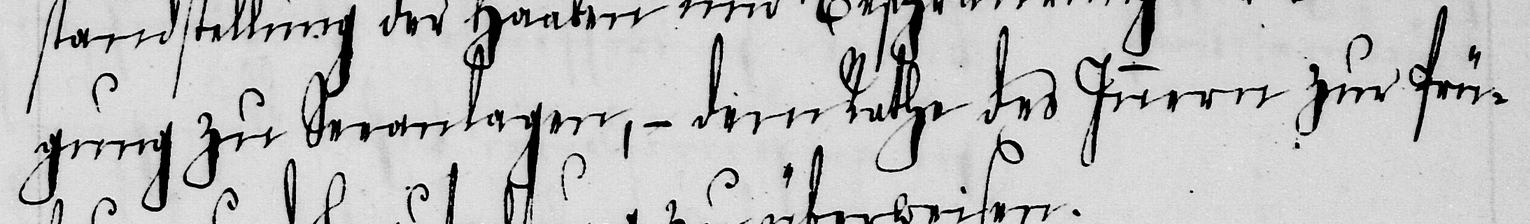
gung zu Seeanlagen, – dem Rathe des Innern zur Prü¬
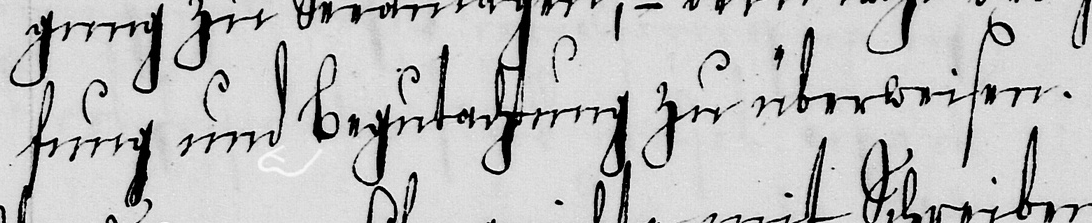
fung und Begutachtung zu überweisen.
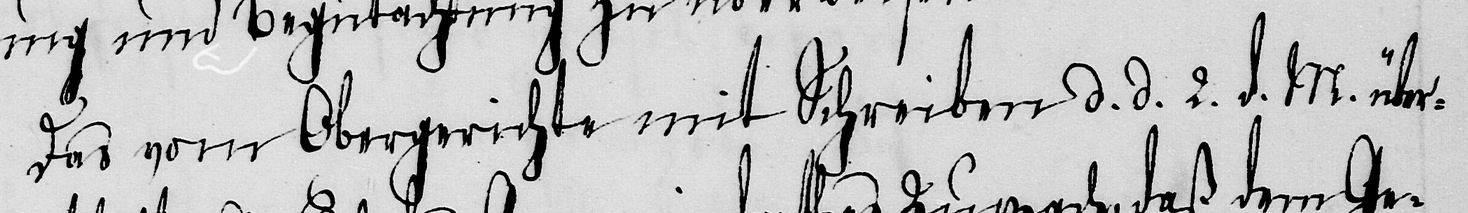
Das vom Obergerichte mit Schreiben d. d. 2. d. M. über¬
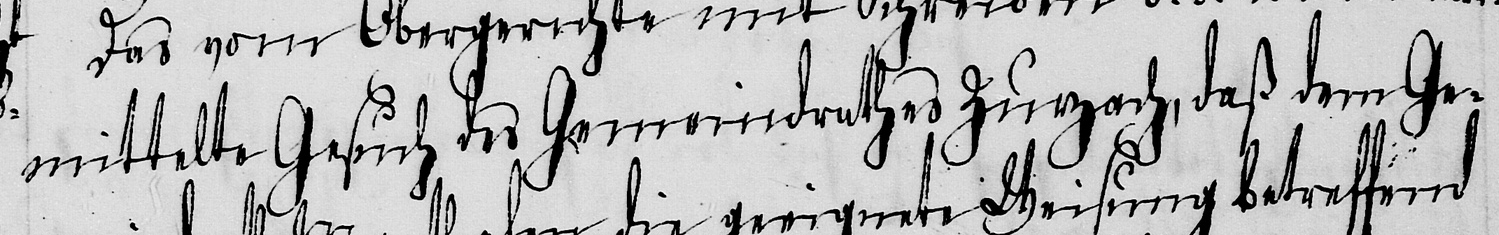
mittelte Gesuch des Gemeindrathes Zurzach, daß dem Ge¬
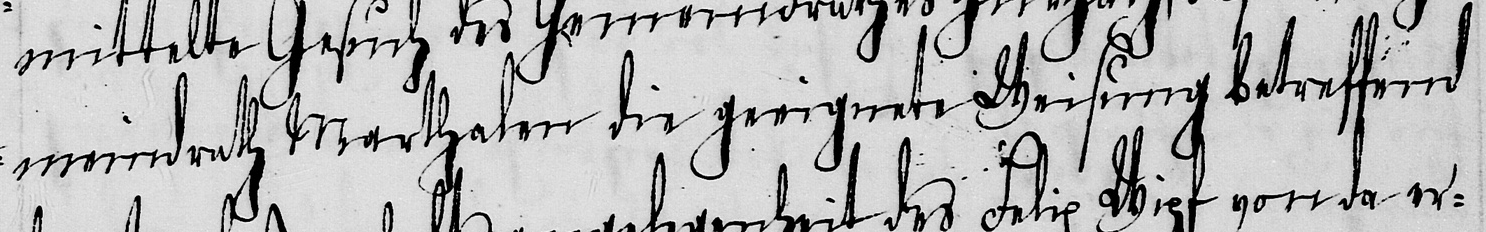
meindrath Marthalen die geeignete Weisung betreffend
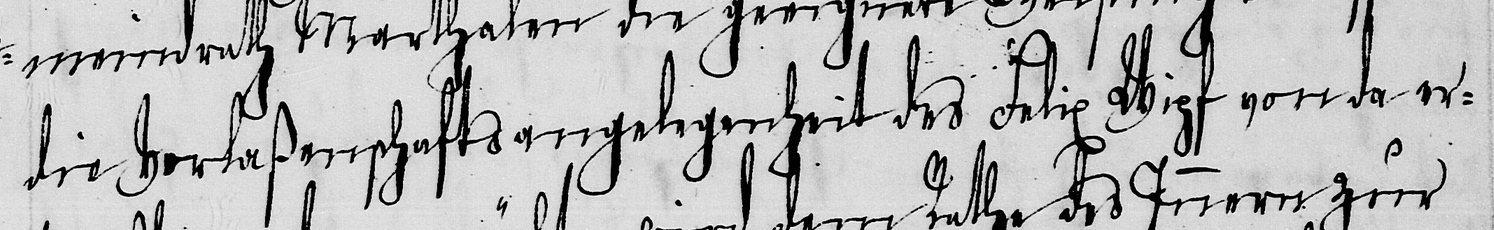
die Verlaßenschaftsangelegenheit des Felix Wipf von da er¬
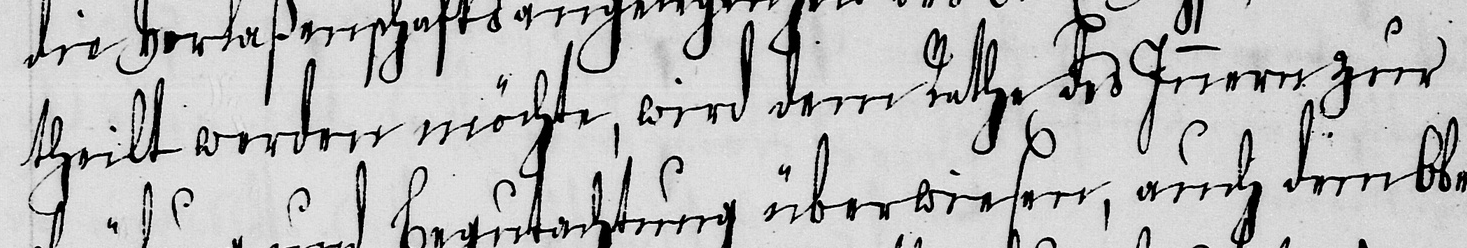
theilt werden möchte, wird dem Rathe des Innern zur
